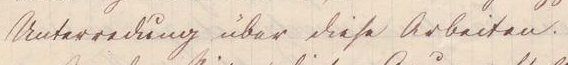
Unterredung über diese Arbeiten.
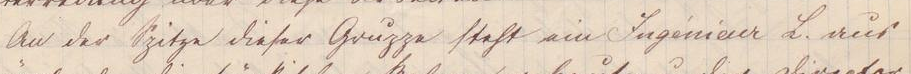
An der Spitze dieser Gruppe steht ein Ingénieur L. aus
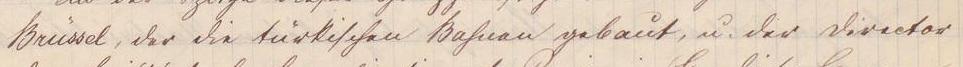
Brüssel, der die türkischen Bahnen gebaut, u. der Director
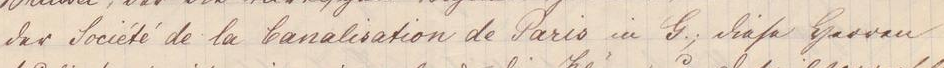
der Société de la Canalisation de Paris in G.; diese Herren
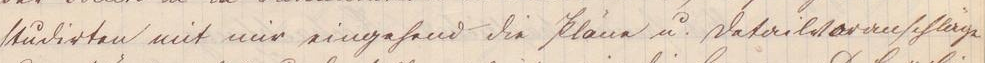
studirten mit mir eingehend die Pläne u. Detailvoranschläge
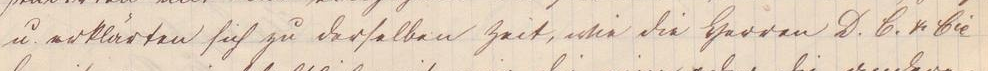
u. erklärten sich zu derselben Zeit, wie die Herrren D. C. & Cie
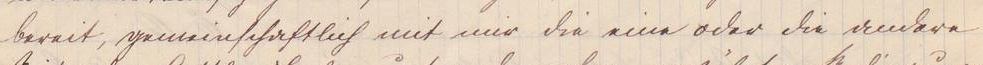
bereit, gemeinschaftlich mit mir die eine oder die andere
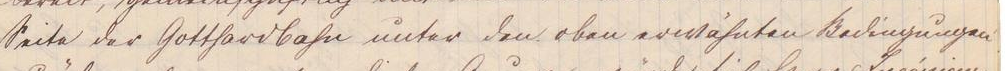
Seite der Gotthardbahn unter den oben erwähnten Bedingungen
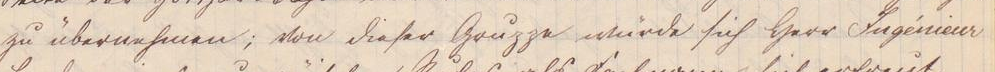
zu übernehmen; von dieser Gruppe würde sich Herr Ingénieur
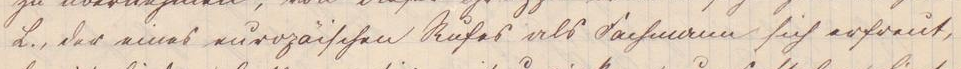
L., der eines europäischen Rufes als Fachmann sich erfreut,
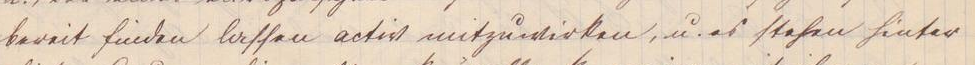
bereit finden lassen activ mitzuwirken, u. es stehen hinter
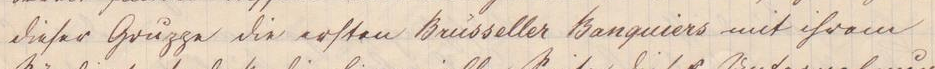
dieser Gruppe die ersten Brüsseller Banquiers mit ihrem
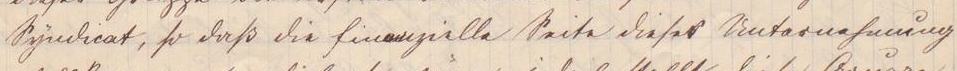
Syndicat, so daß die finanzielle Seite dieser Unternehmung
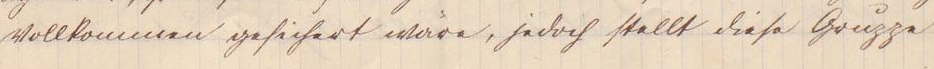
vollkommen gesichert wäre, jedoch stellt diese Gruppe
